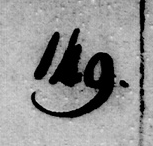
betra¬
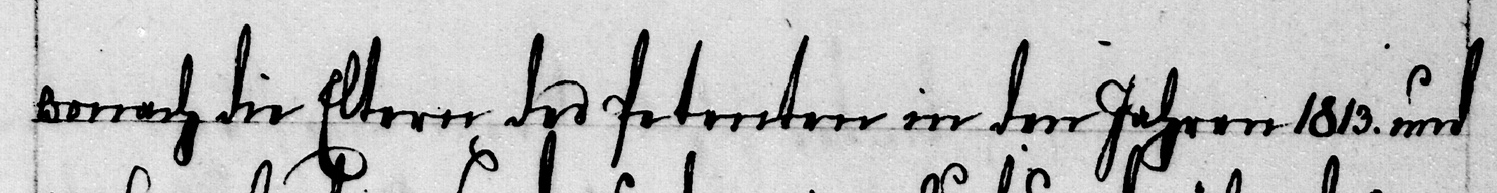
wonach die Eltern des Petenten in den Jahren 1813. und
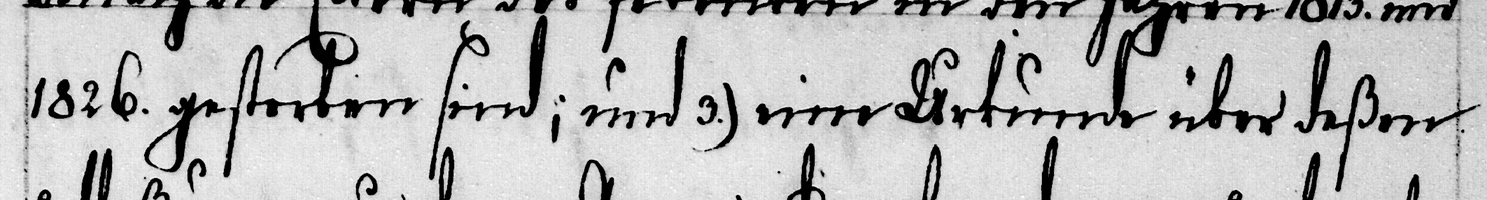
1826. gestorben sind; und 3.) eine Urkunde über deßen
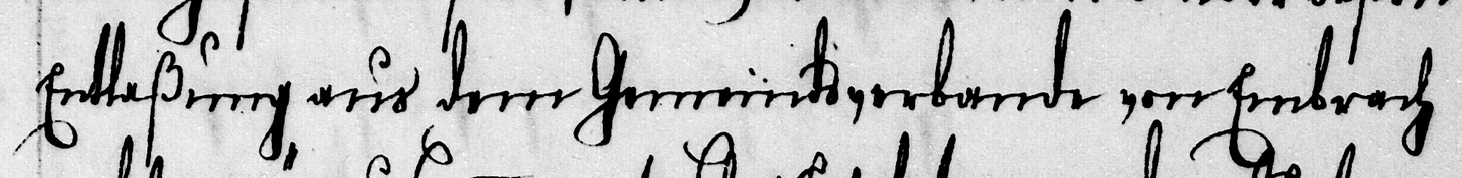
Entlaßung aus dem Gemeindsverbande von Embrach
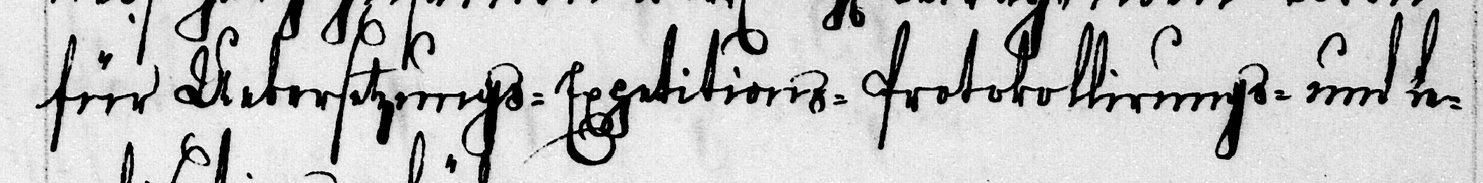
für Uebersetzungs-Expetitions-Protokollirungs- und Le¬
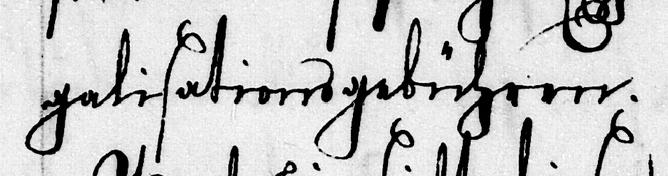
galisationsgebühren.
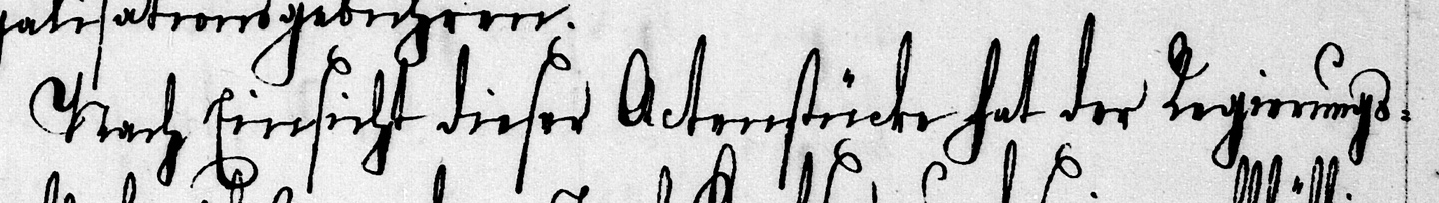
Nach Einsicht dieser Actenstücke hat der Regierungs¬
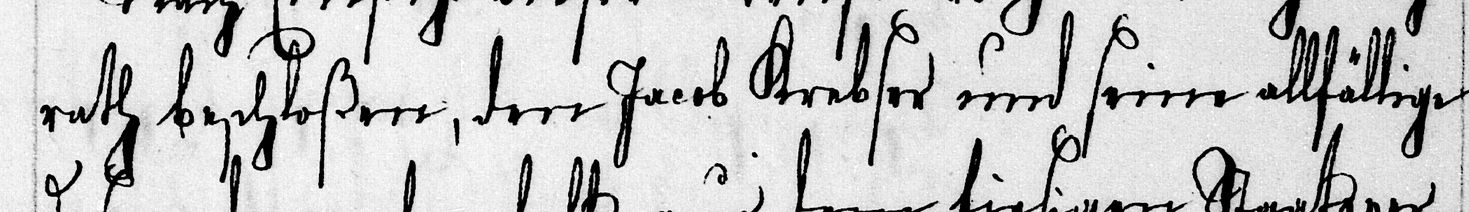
rath beschloßen, den Jacob Krebser und seine allfäl¬
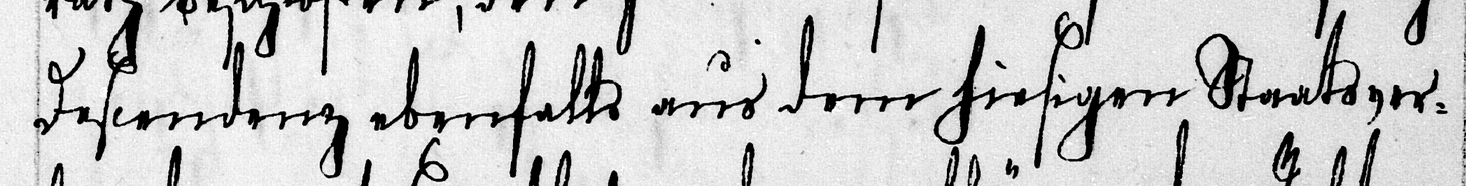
Descendenz ebenfalls aus dem hiesigen Staatsver¬
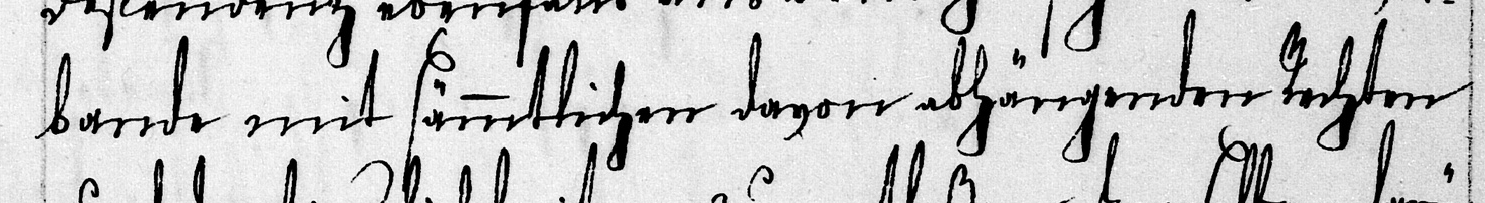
bande mit sämmtlichen davon abhängenden Rechten
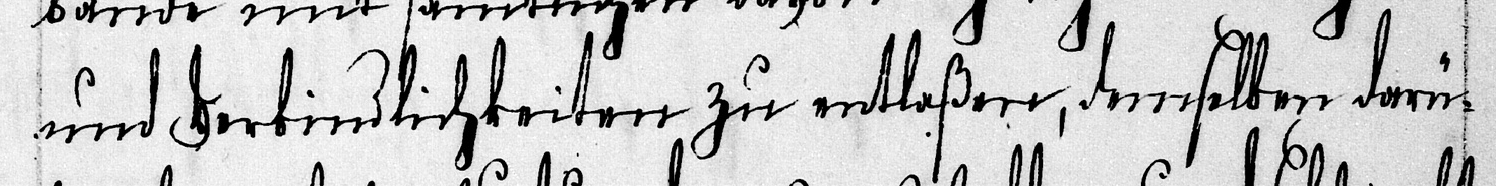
und Verbindlichkeiten zu entlaßen, demselben darü¬
